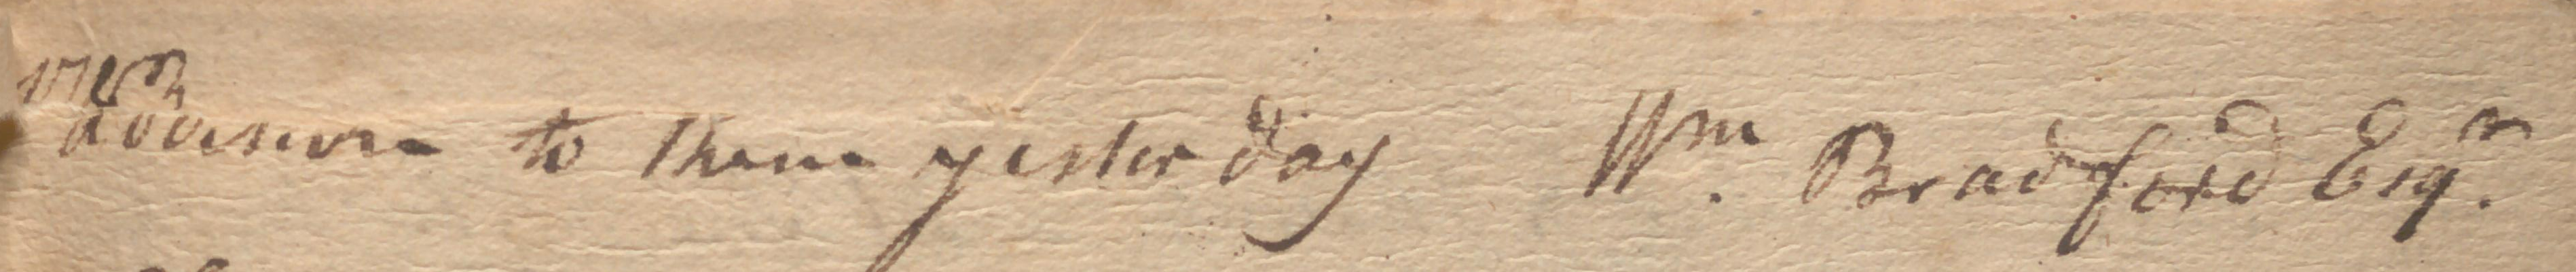answer to them yesterday W^m. Bradford Esq^r.
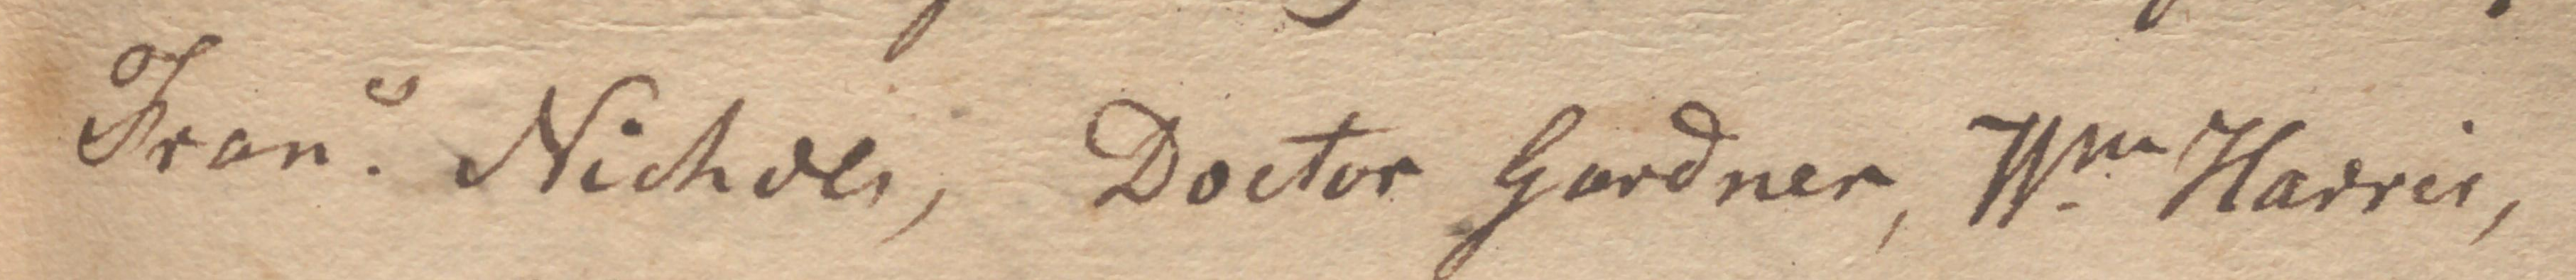Fran^s. Nichols, Doctor Gardner, W^m. Harris,
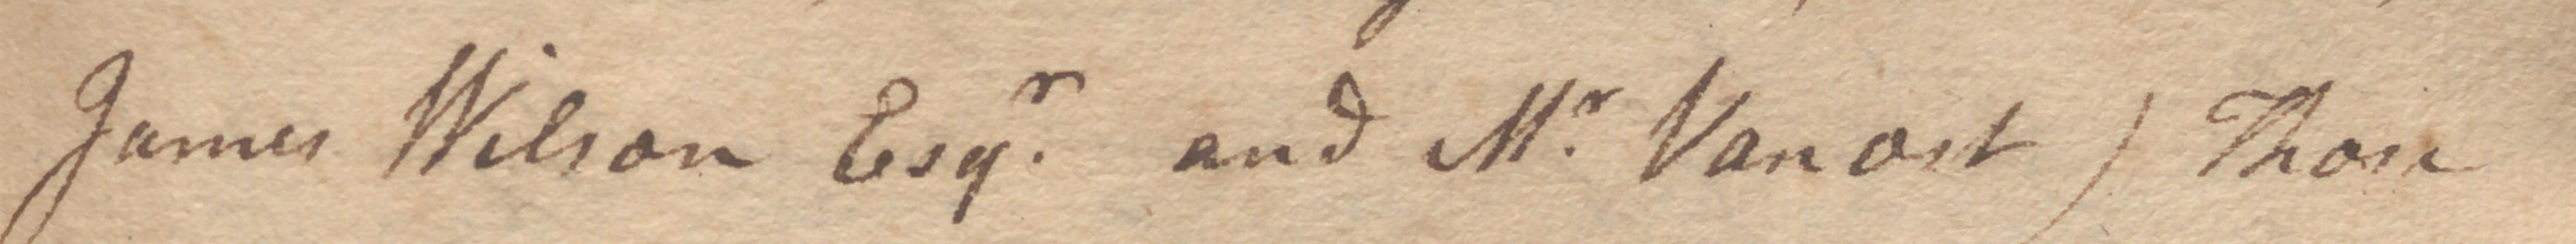James Wilson Esq^r. and M^r. Vanast) Those
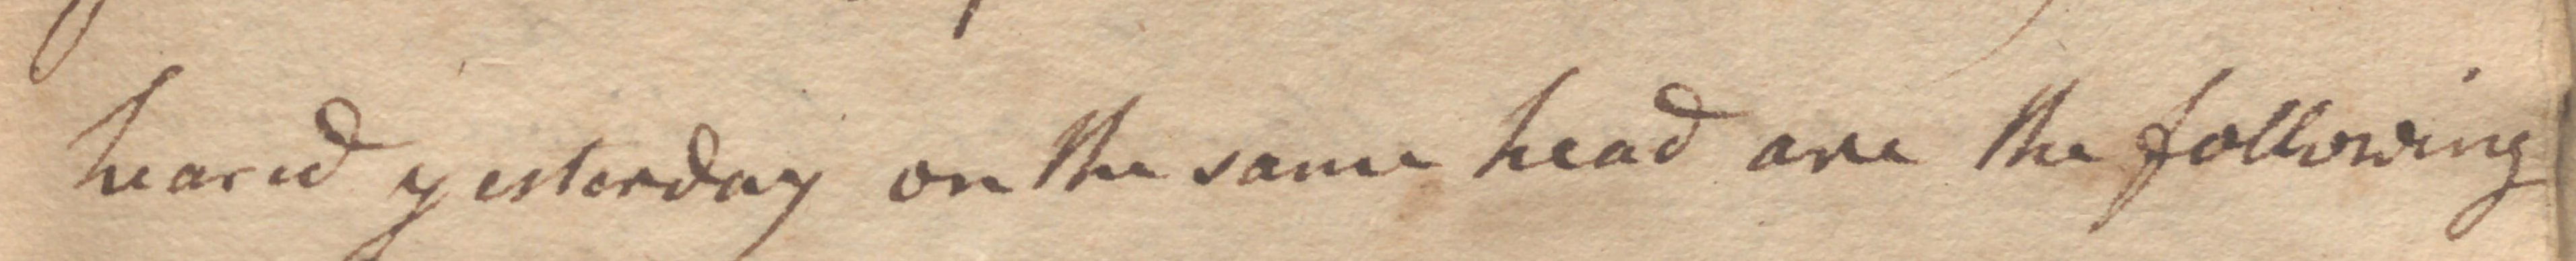heard yesterday on the same head are the following
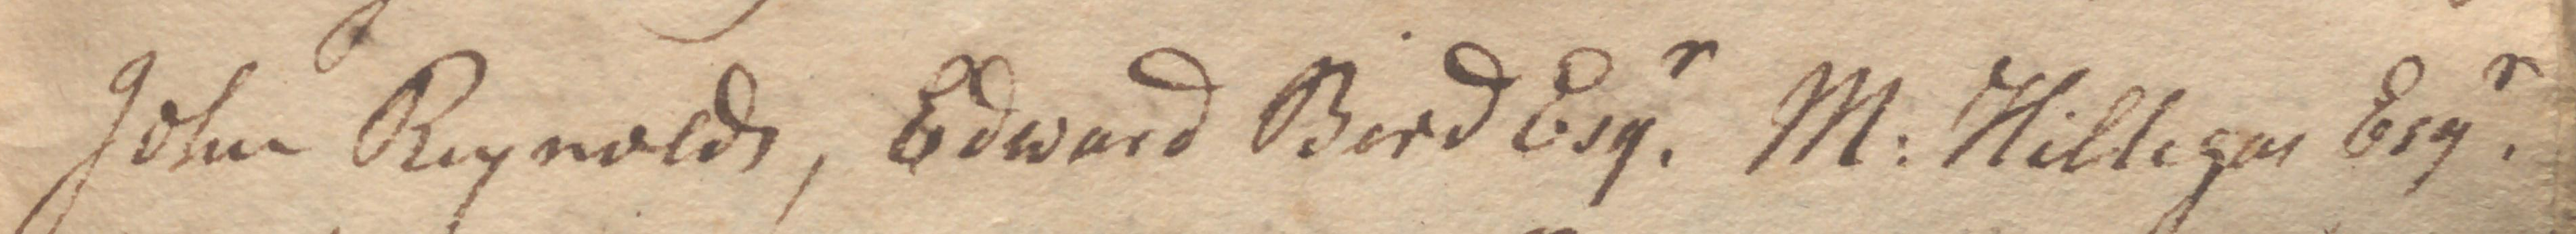John Reynolds, Edward Bird Esq^r. M. Hilligas Esq^r.
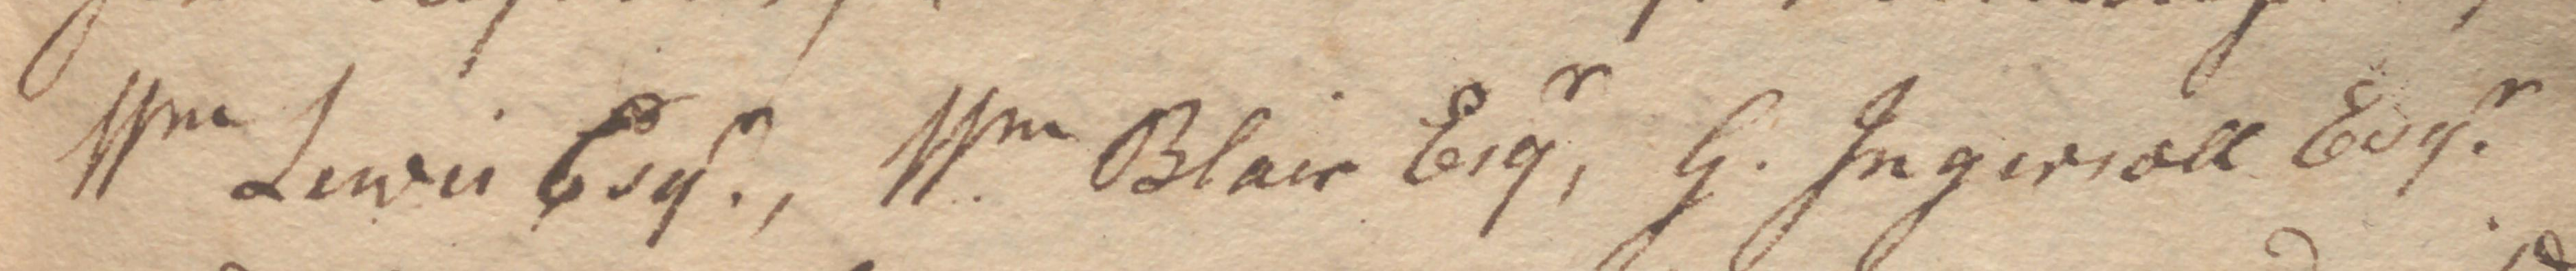W^m Lewis Esq^r., W^m. Blair Esq^r. G. Ingersoll Esq^r.
